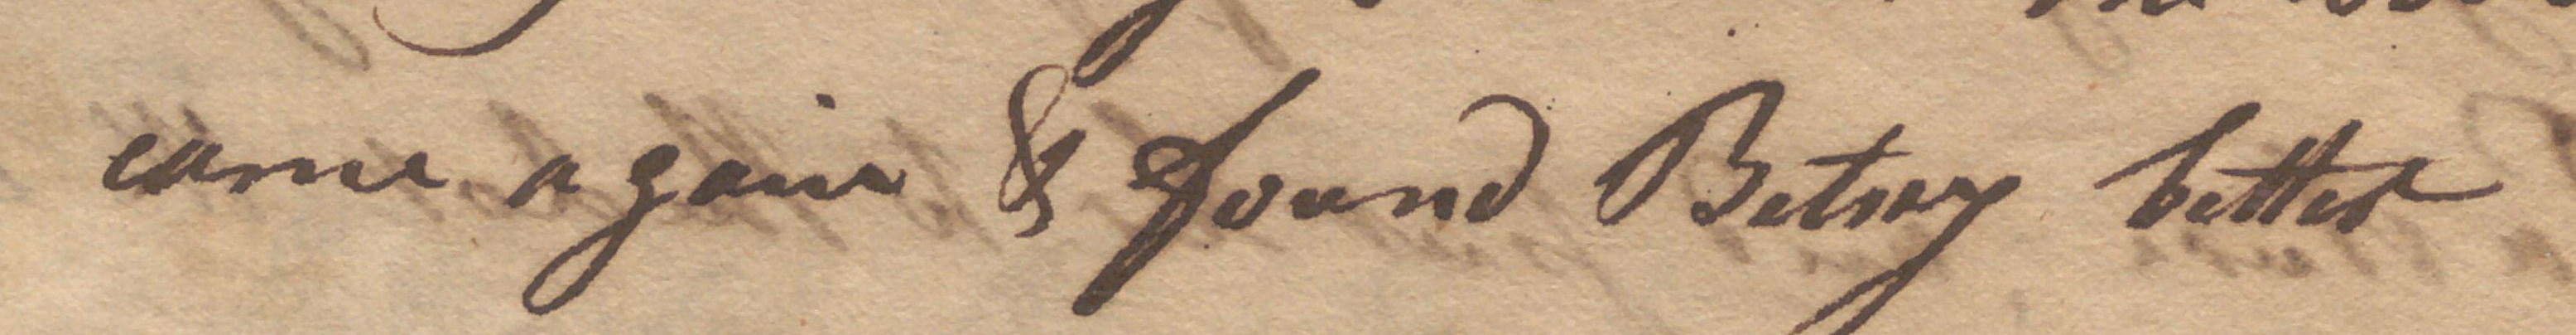came again & found Betsey better
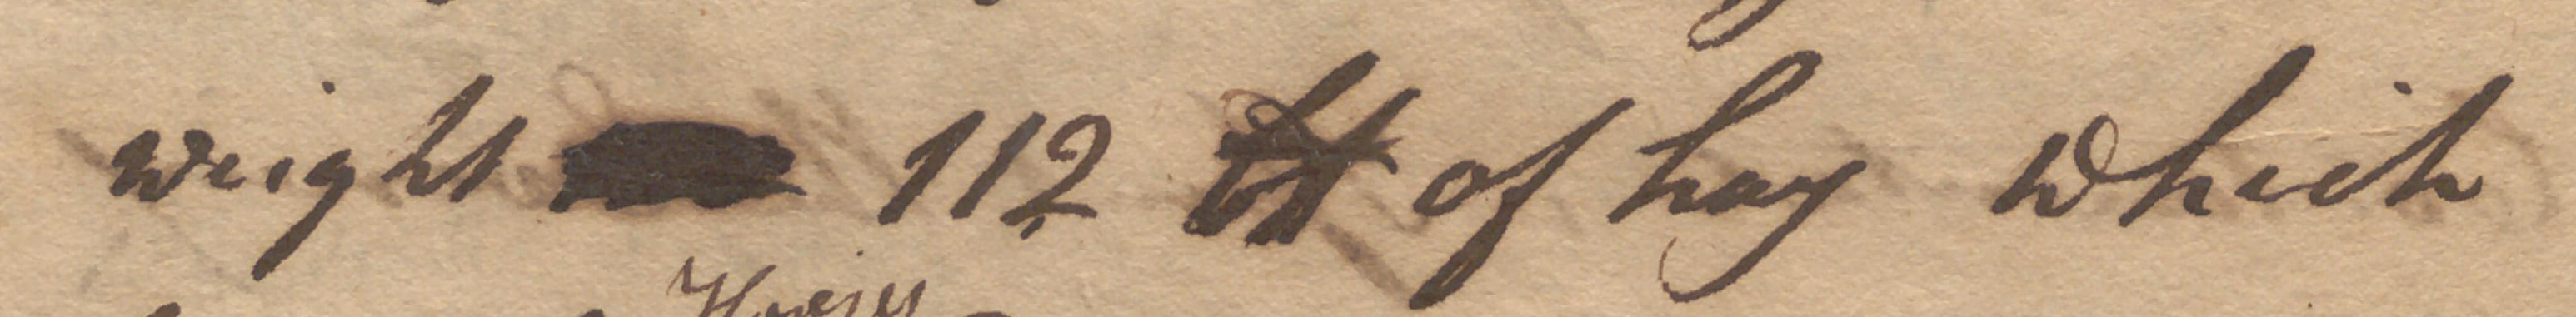weight 112 lb of hay which
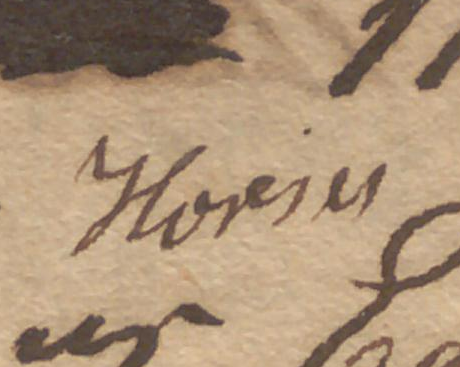Horses
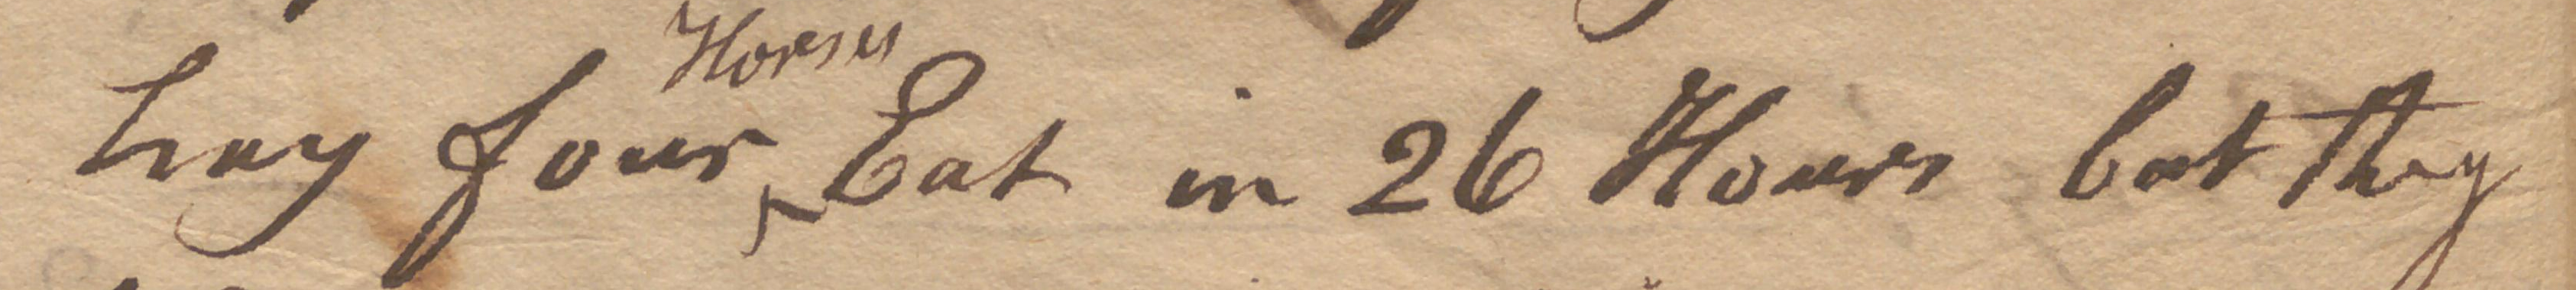hay four ^ Eat in 26 Hours but they
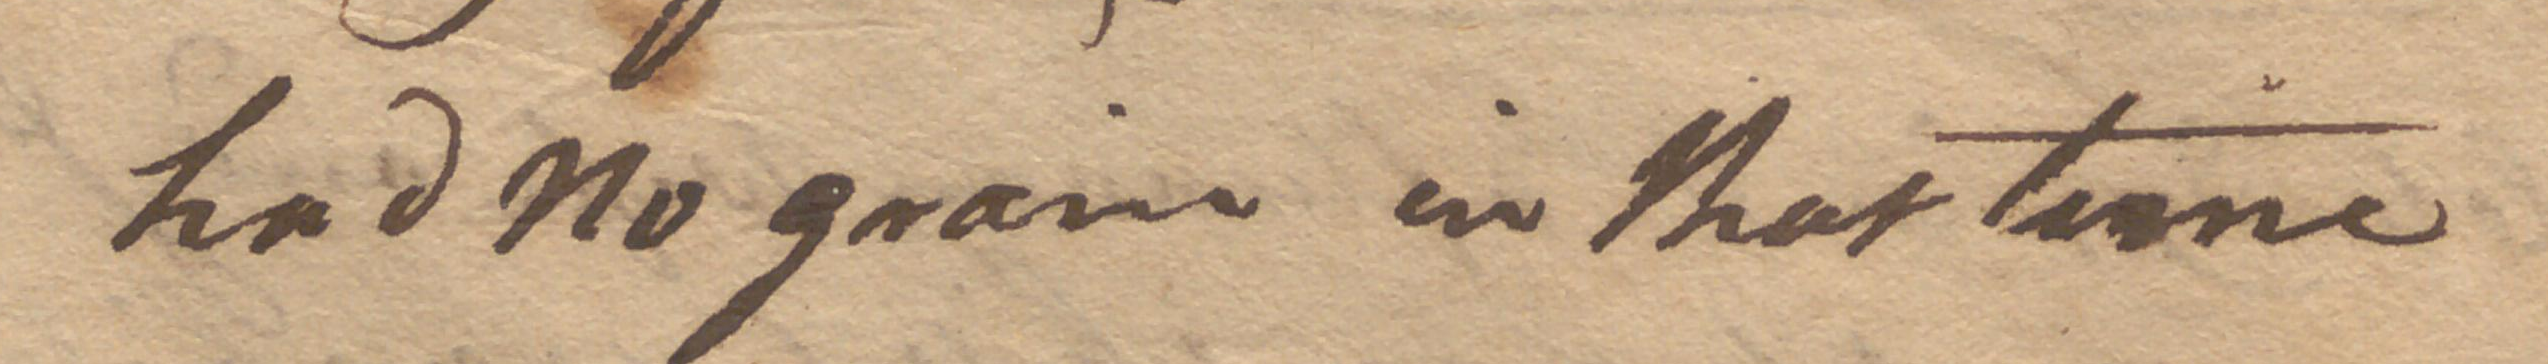had no grain in that time
